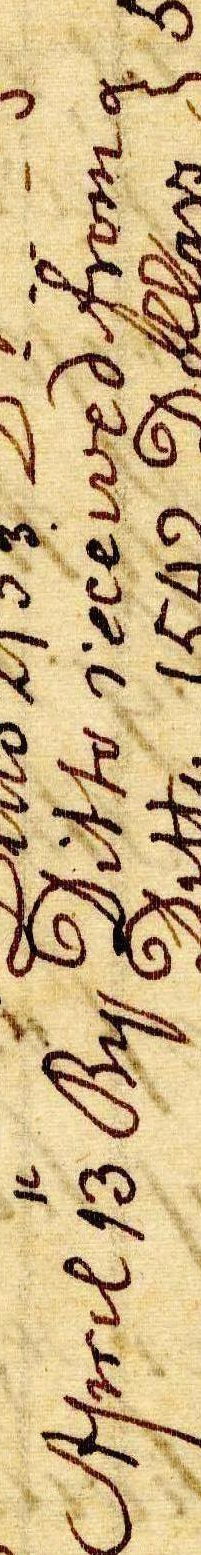April 13^th By Ditto received from
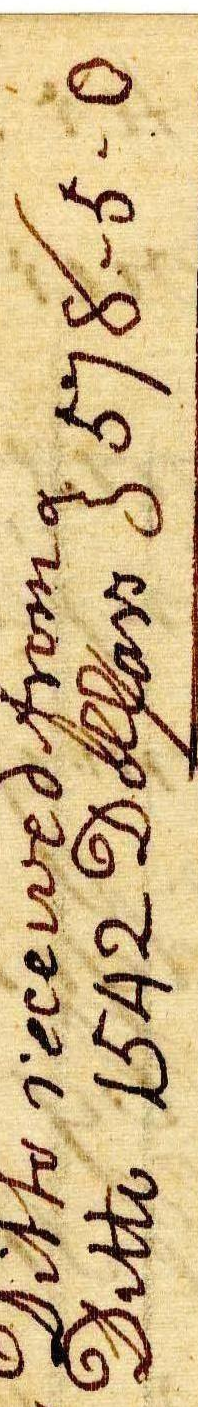Ditto 1542 Dollars} 578.5.0
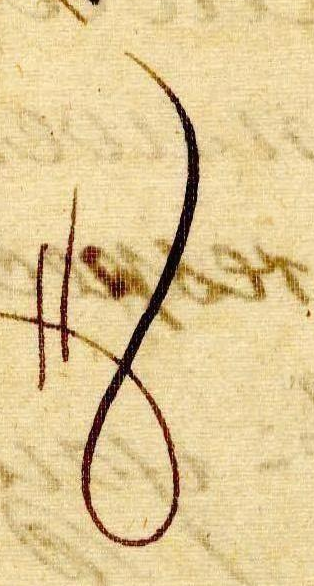£
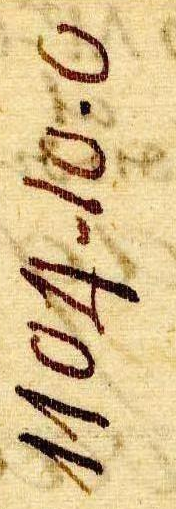1104..10.0
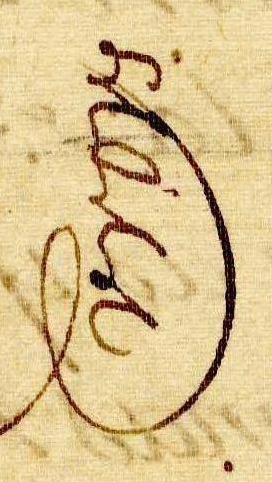Errors
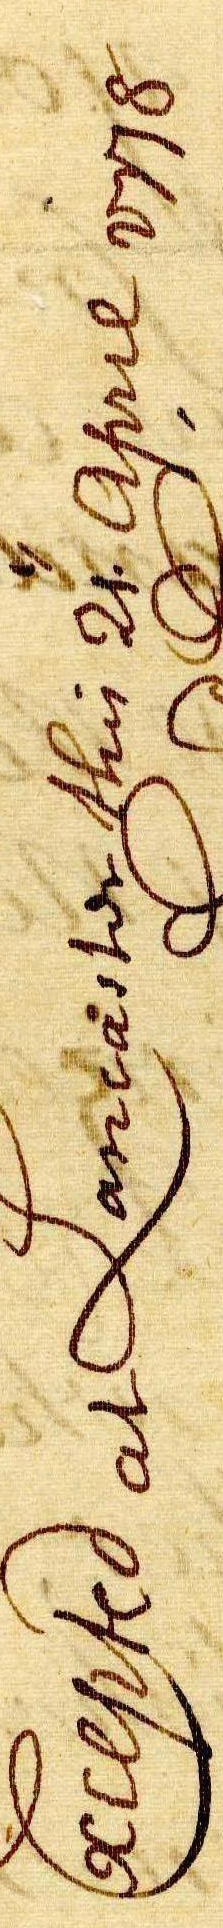Excepted at Lancaster this 21^t. April 1778
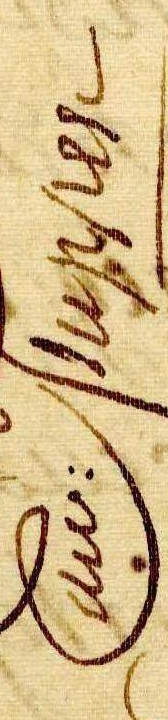Edw:^d Shippen
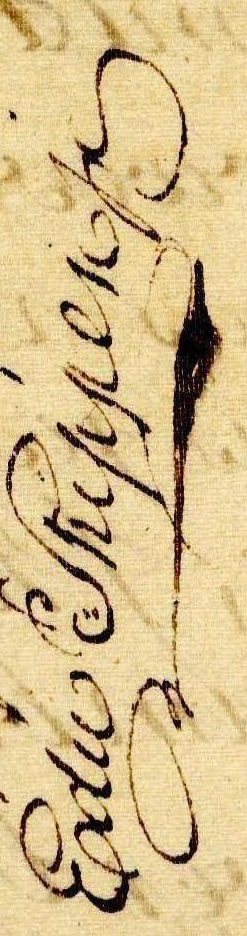Edw^d: Shippen Jr
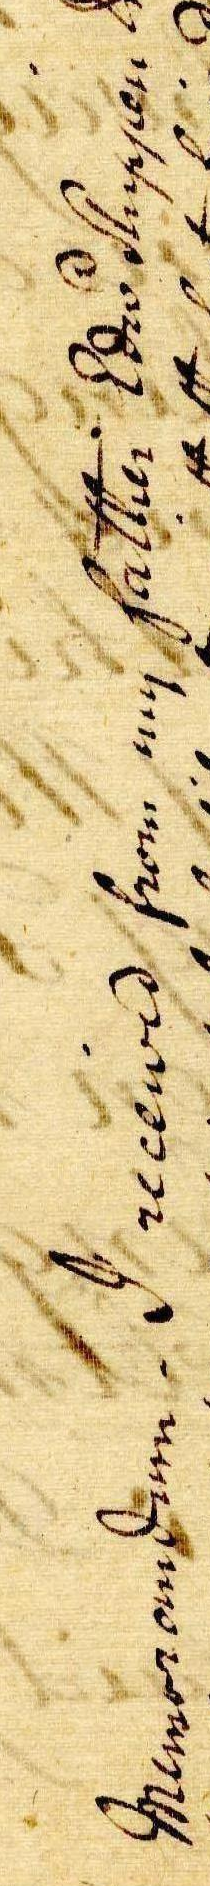Memorandum. I received from my father Edw^d Shippen
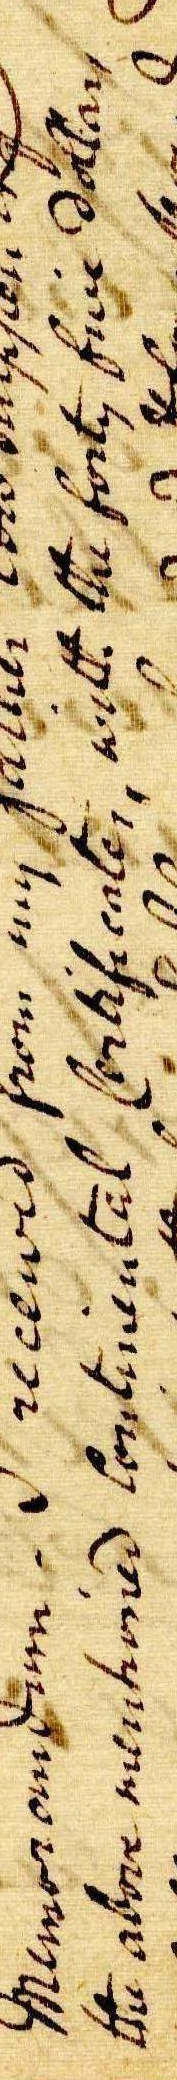the above mentioned Continental Certificates, with the forty five dollars
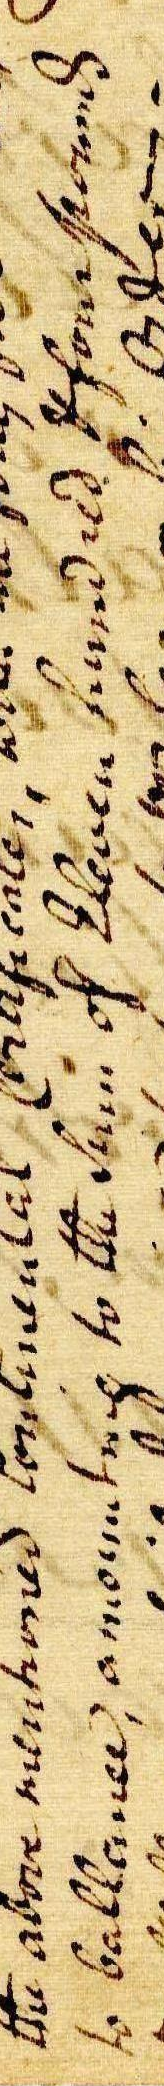to ballance, amounting to the Sum of Eleven hundred & four pounds
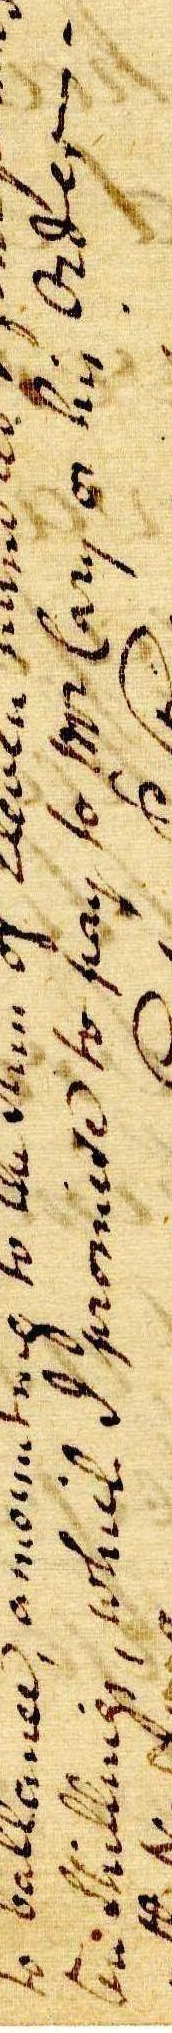ten shillings, which I promise to pay to M^r Cary on his Order--
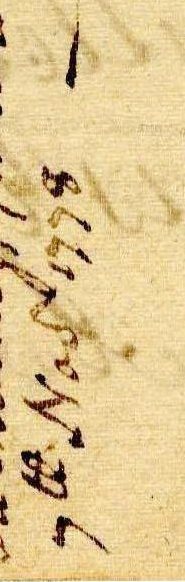7^th Nov^r 1778-
